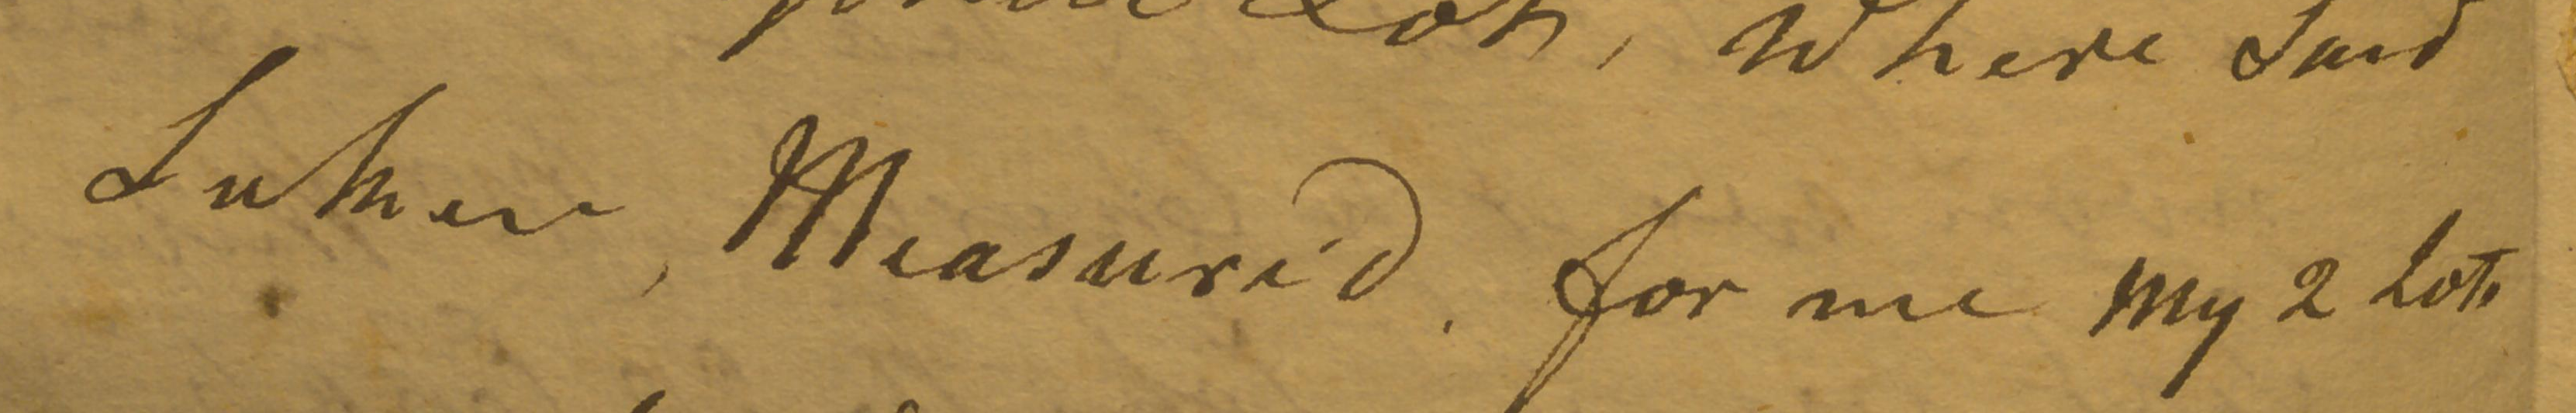Luken Measured. for me my 2 Lots
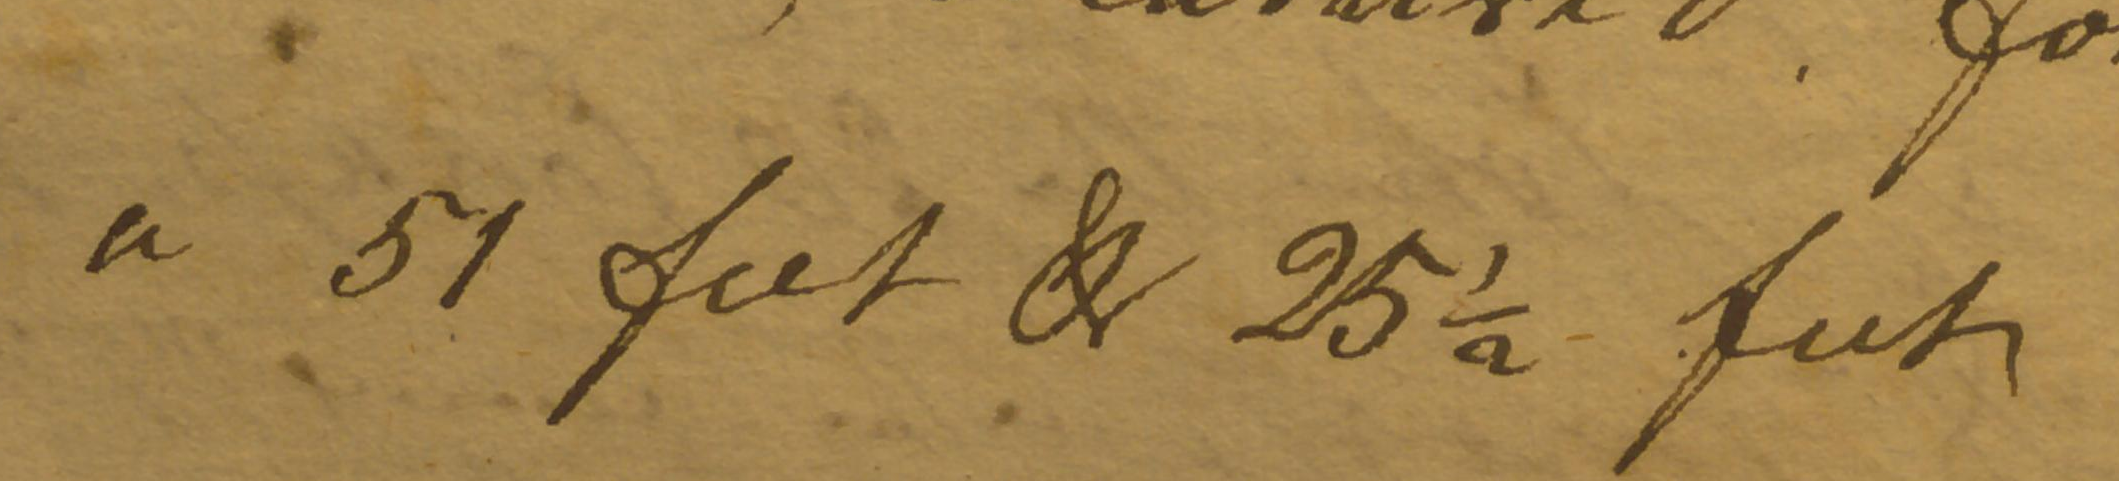a 51 feet & 25 1/2 feet
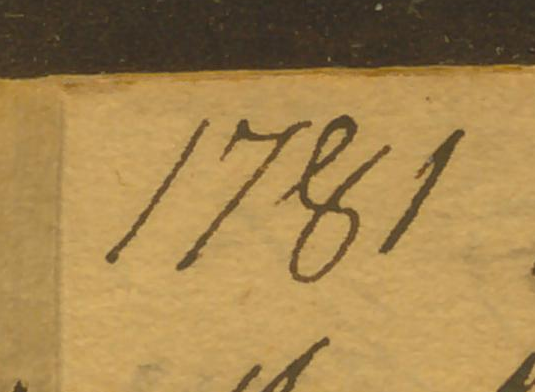1781
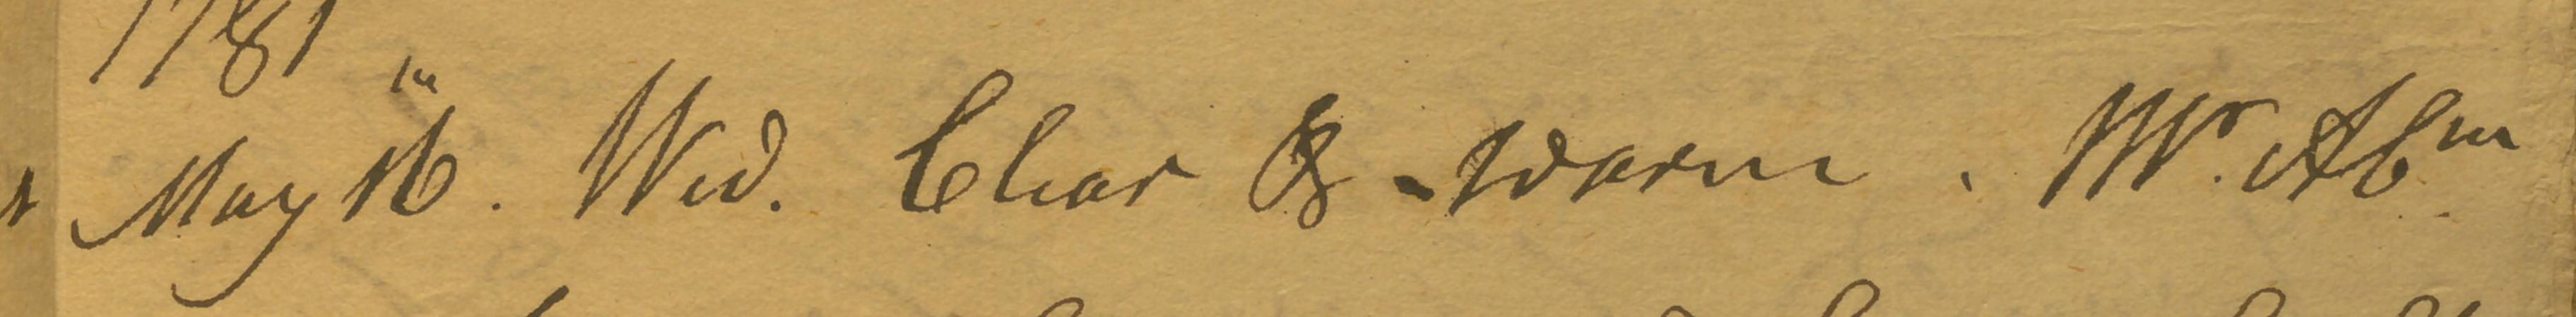May 16^th. Wed. Clear & Warm. M^r. Ab^m.
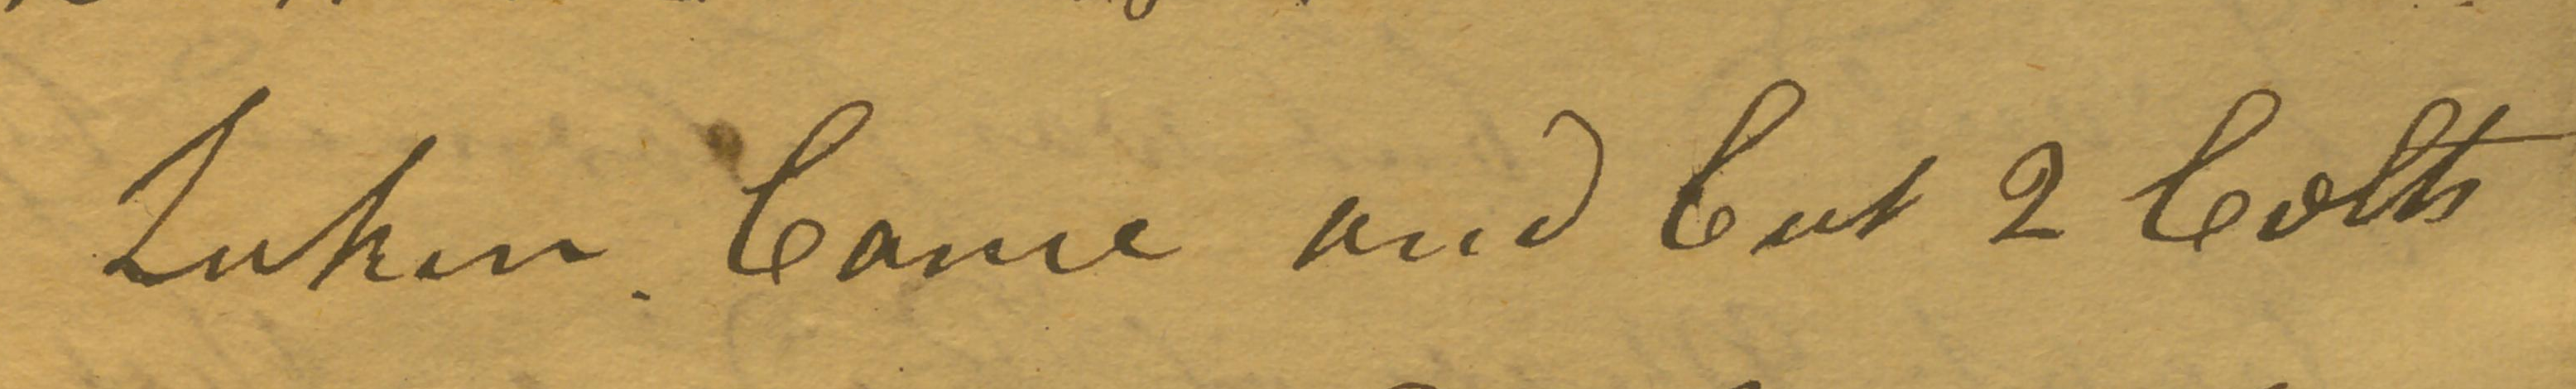Luken Came and Cut 2 Colts
